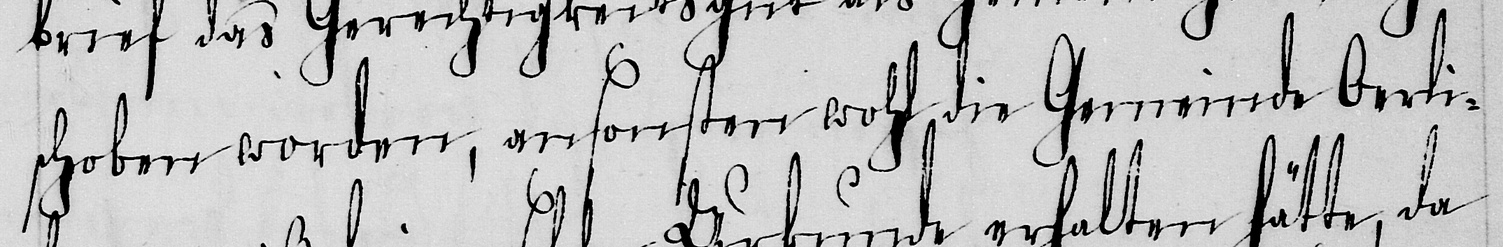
schoben worden, ansonsten wohl die Gemeinde Oerli¬
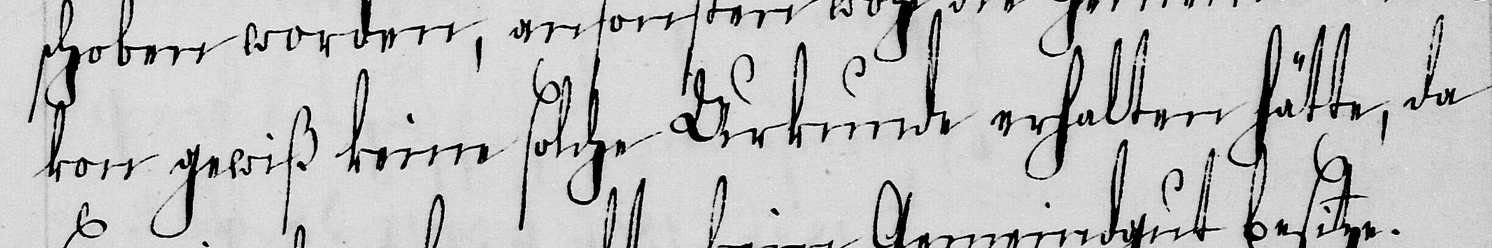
kon gewiß keine solche Urkunde erhalten hätte, da
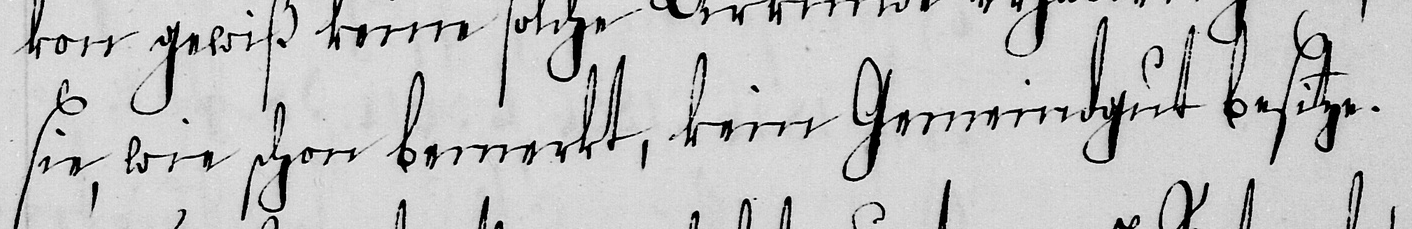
sie, wie schon bemerkt, kein Gemeindgut besitze.
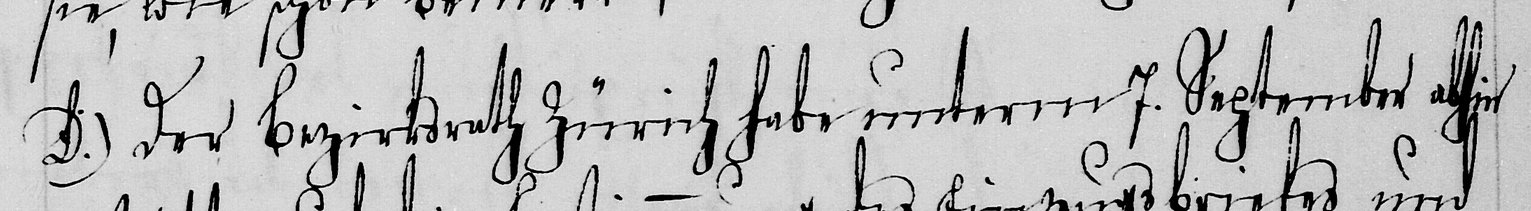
D.) Der Bezirksrath Zürich habe unterm 7. September abh¬
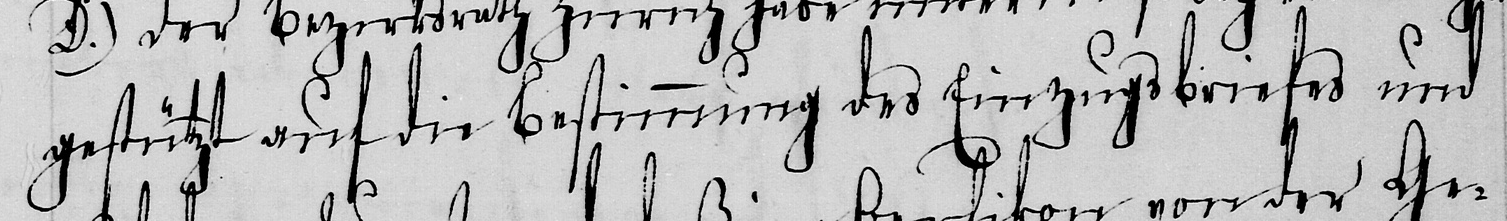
gestützt auf die Bestimmung des Einzugsbriefes und
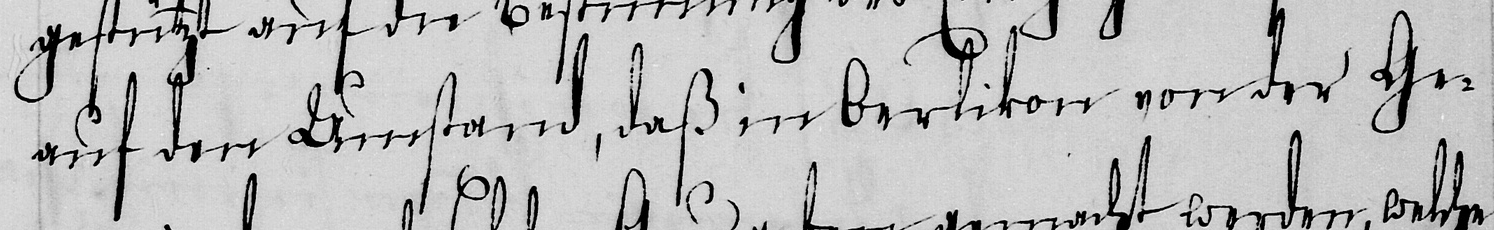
auf den Umstand, daß in Oerlikon von der Ge¬
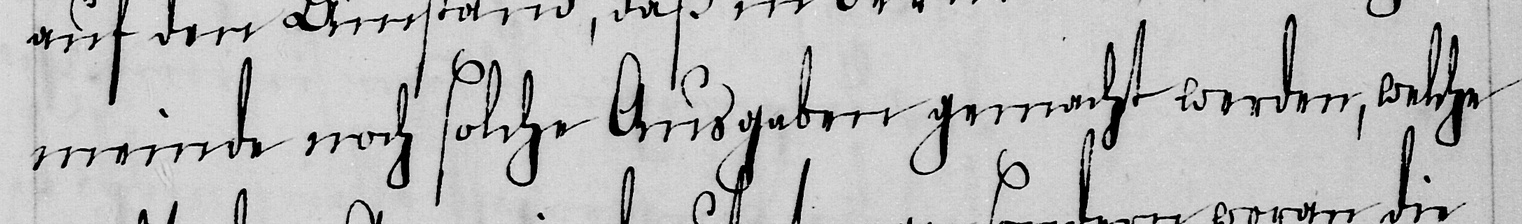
meinde noch solche Ausgaben gemacht werden, welche
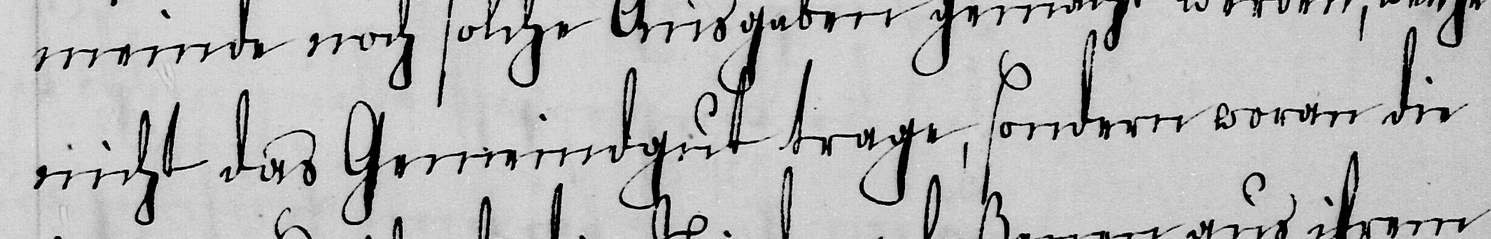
nicht das Gemeindgut trage, sondern woran die
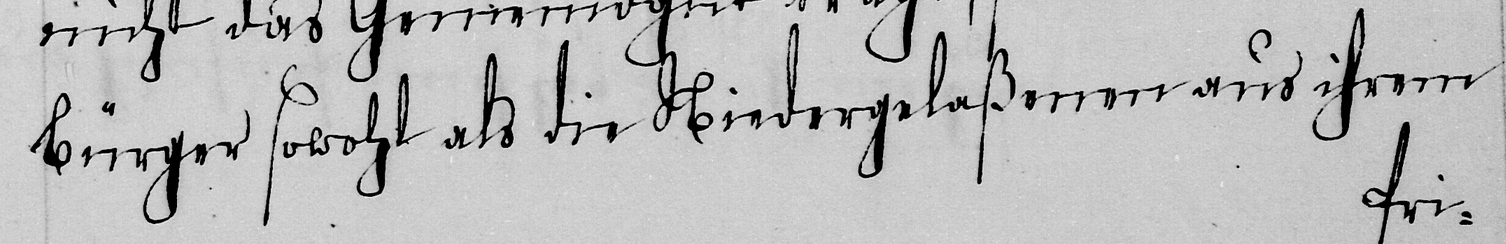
Bürger sowohl als die Niedergelaßenen aus ihrem
